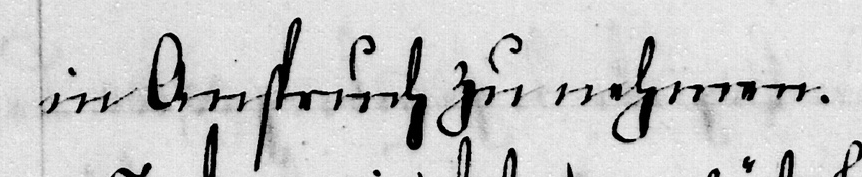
in Anspruch zu nehmen.
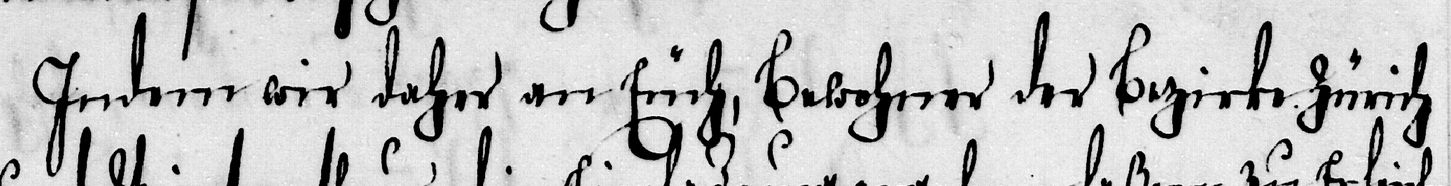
Indem wir daher an Euch, Bewohner der Bezirke Zürich
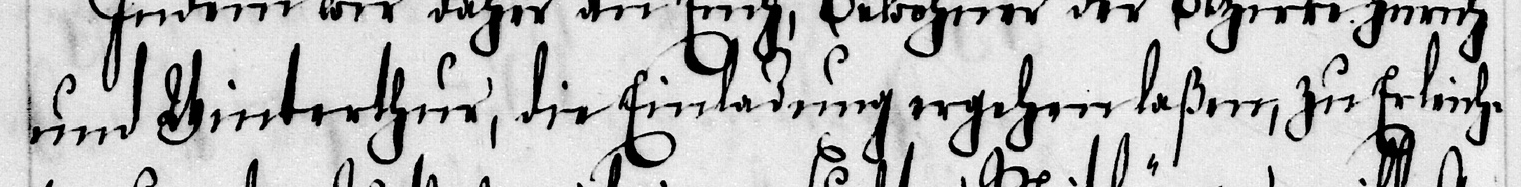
und Winterthur, die Einladung ergehen laßen, zu Erleich¬
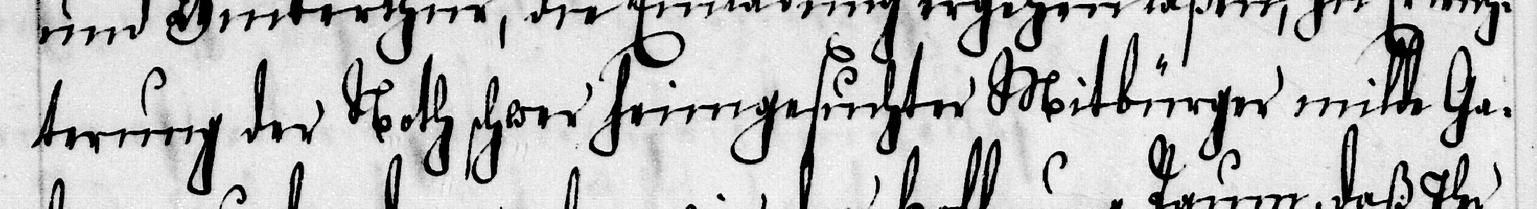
terung der Noth schwer heimgesuchter Mitbürger milde Ga¬
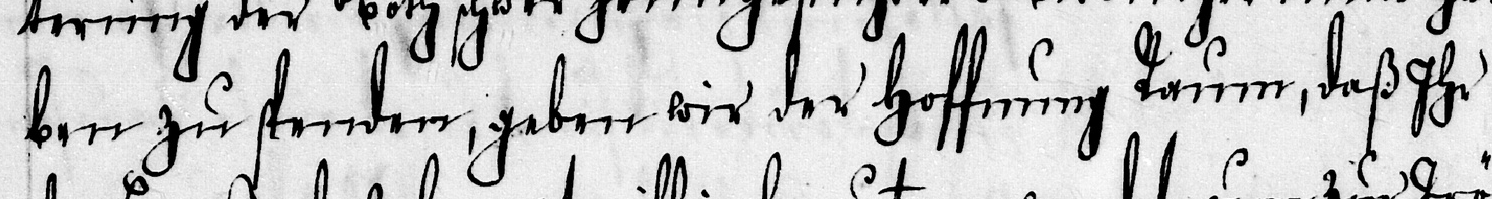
ben zu spenden, geben wir der Hoffnung Raum, daß Ihr
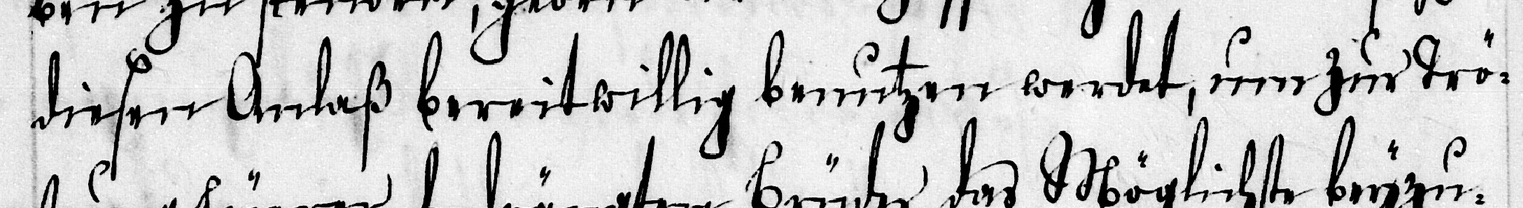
diesen Anlaß bereitwillig benutzen werdet, um zur Trö¬
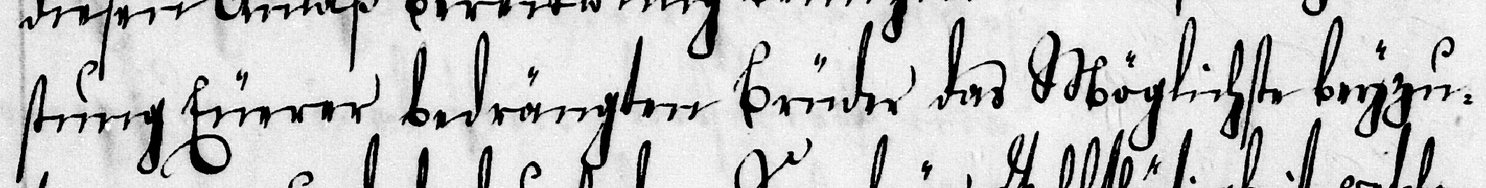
stung Euerer bedrängten Brüder das Möglichste beyzu¬
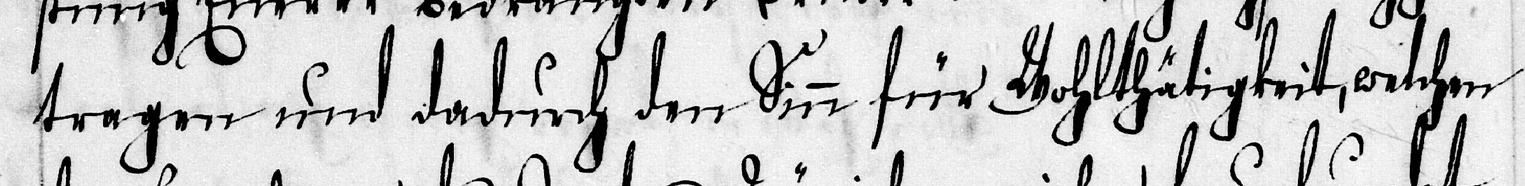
tragen und dadurch den Sinn für Wohlthätigkeit, welchen
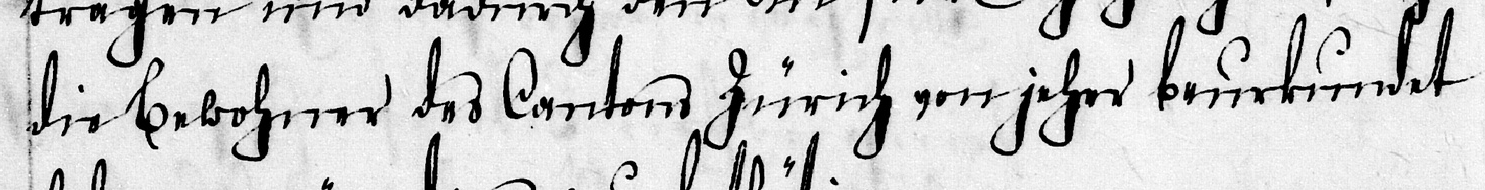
die Bewohner des Cantons Zürich von jeher beurkundet
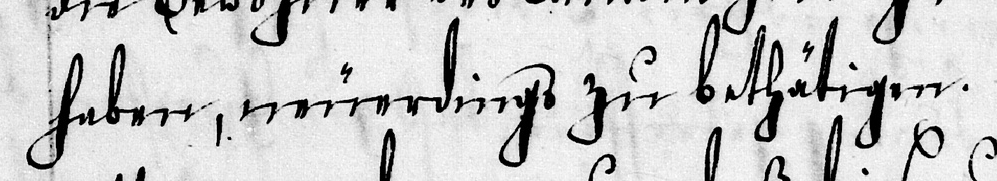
haben, neuerdings zu bethätigen.
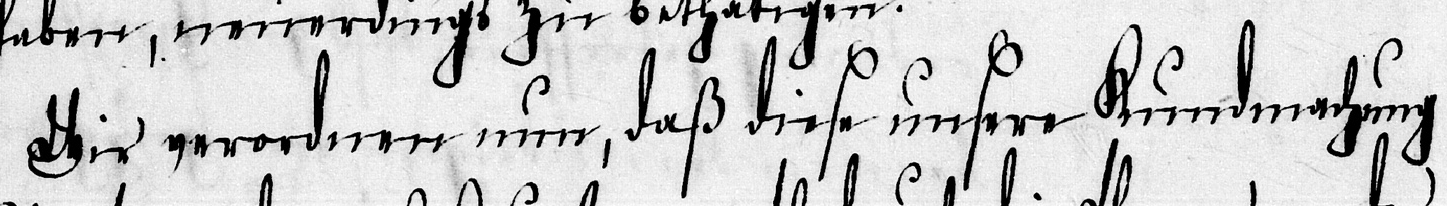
Wir verordnen nun, daß diese unsere Kundmachung
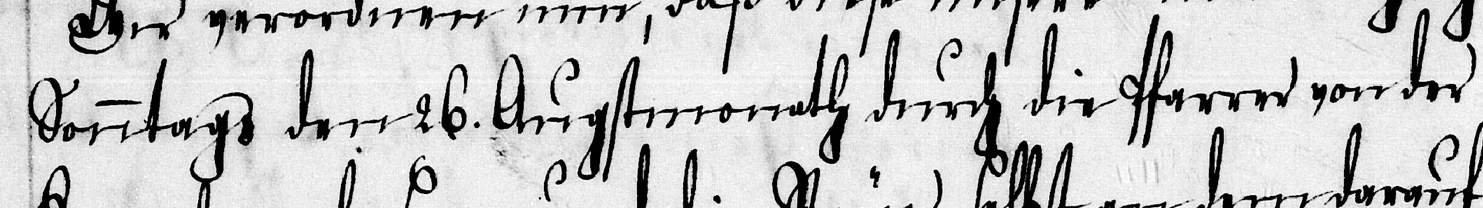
Sonntags den 26. Augstmonath durch die Pfarrer von der
